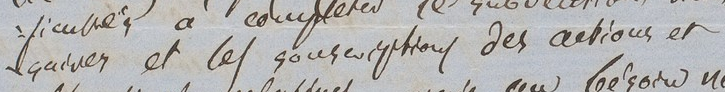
saires et les souscriptions des actions et
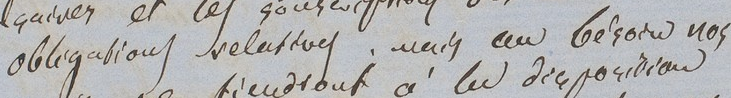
obligations relatives, mais au bésoin nos
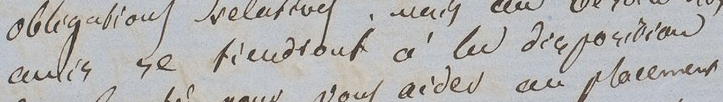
cenis se tiendront à la disposition
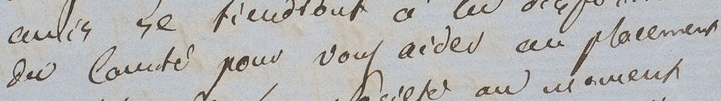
du Comité pour vous aider au placement
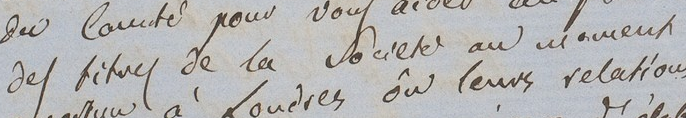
des titres de la Société au moment
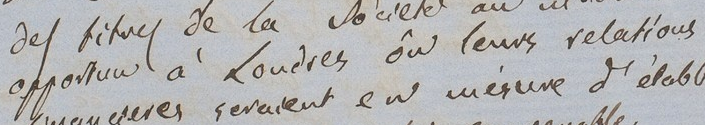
opportun à Londres ôu leurs relations
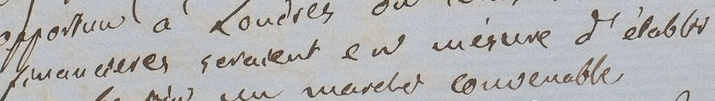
financieres seraient en mésure d'établir
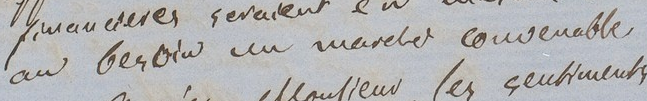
au besoin un marché convenable.
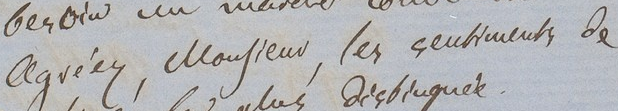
Agréez, Monsieur, les sentiments de
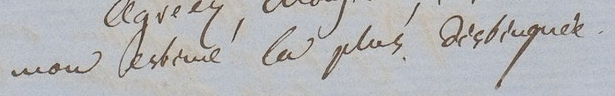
mon estime la plus distinguée.
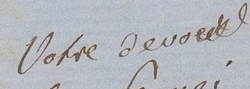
Votre devoué
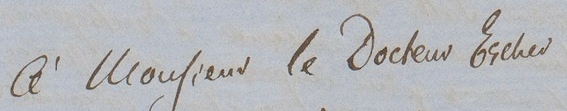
À Monsieur le Docteur Escher
